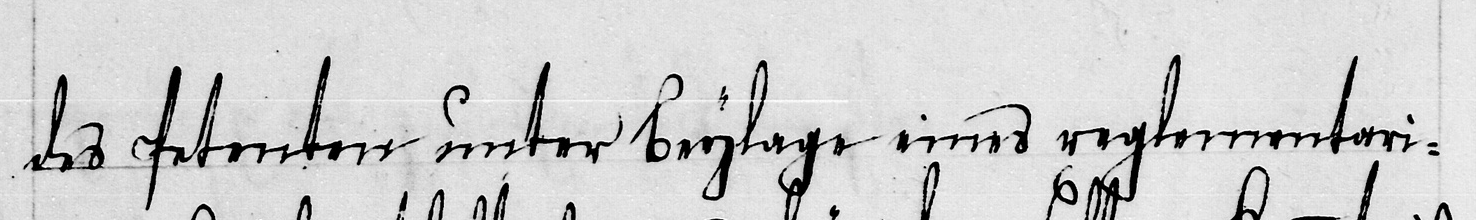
des Petenten unter Beylage eines reglementari¬
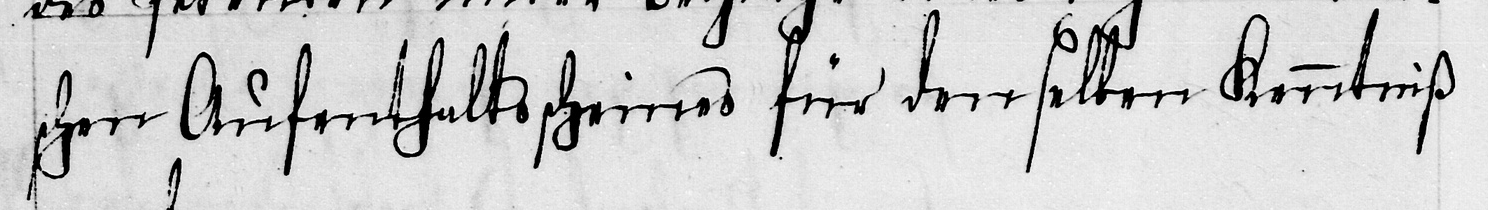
schen Aufenthaltsscheines für denselben Kenntniß
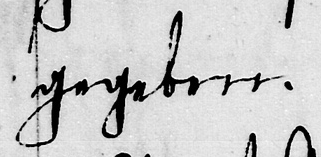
gegeben.
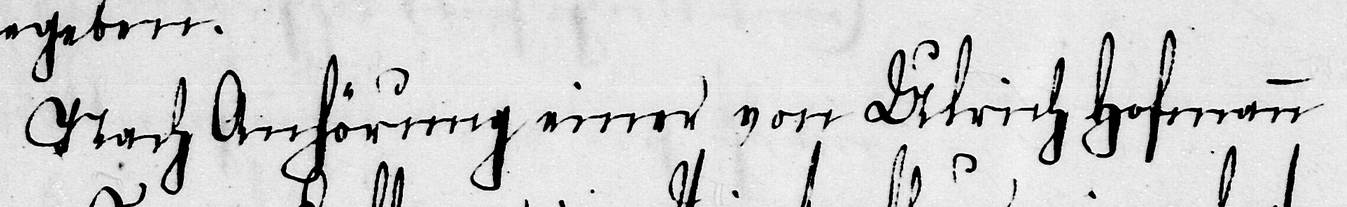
Nach Anhörung einer von Ulrich Hofmann
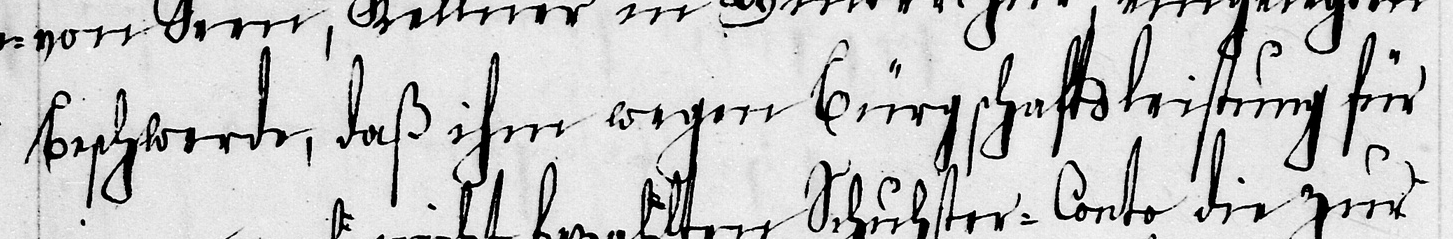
Beschwerde, daß ihm wegen Bürgschaftsleistung für
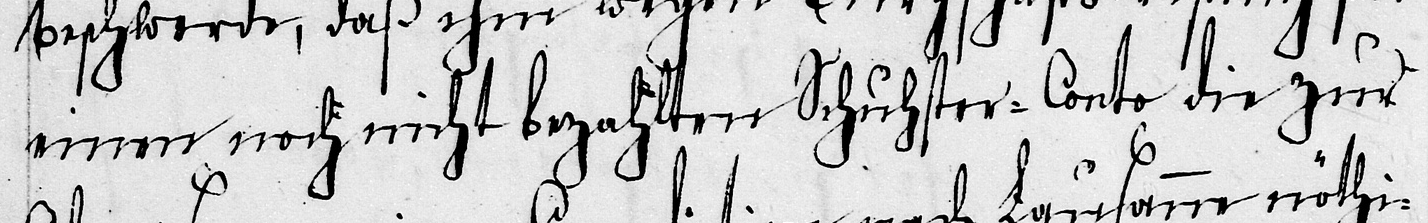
einen noch nicht bezahlten Schuhster-Conto die zur
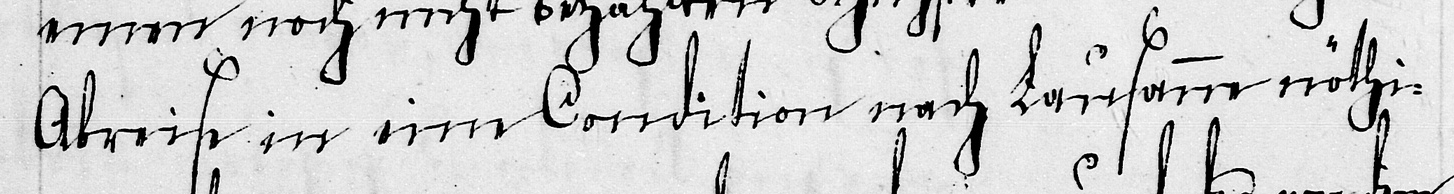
Abreise in eine Condition nach Lausanne nöthi¬
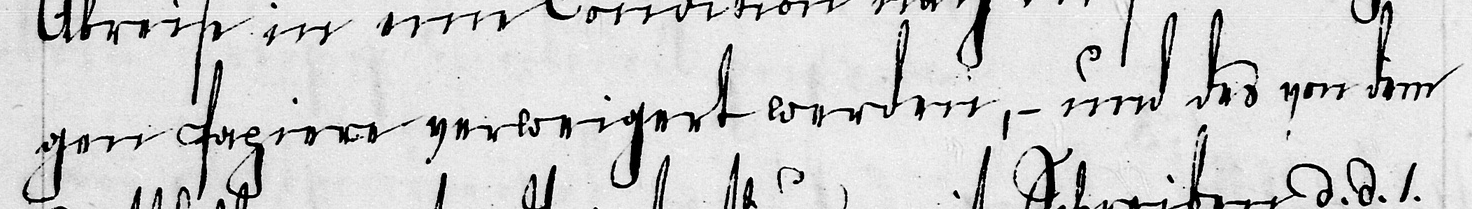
gen Papiere verweigert werden, – und des von dem
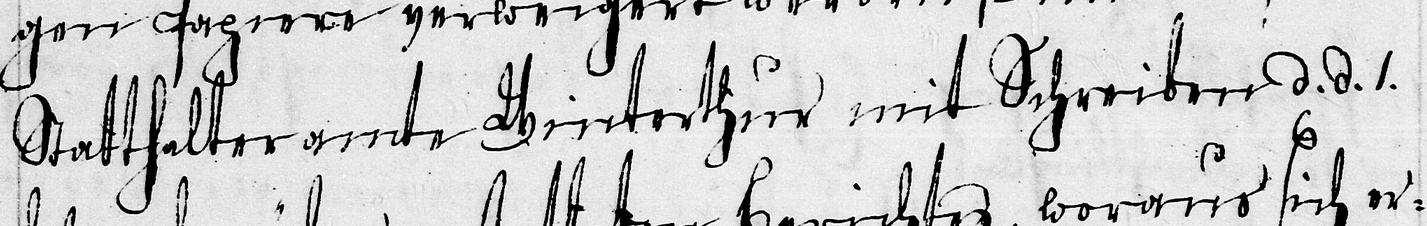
Statthalteramte Winterthur mit Schreiben d. d.
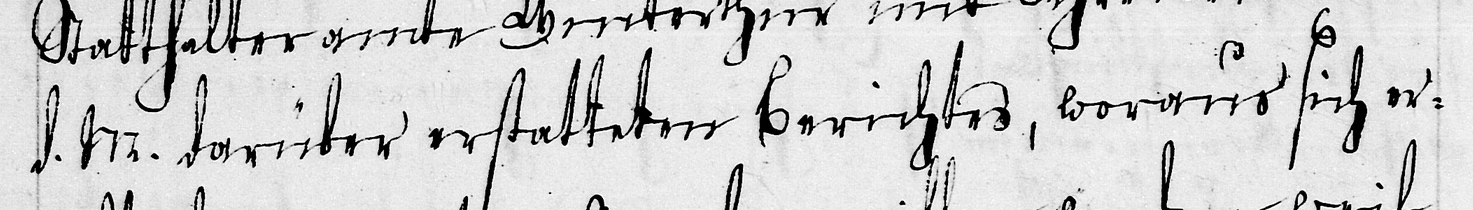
d. M. darüber erstatteten Berichtes, woraus sich er¬
